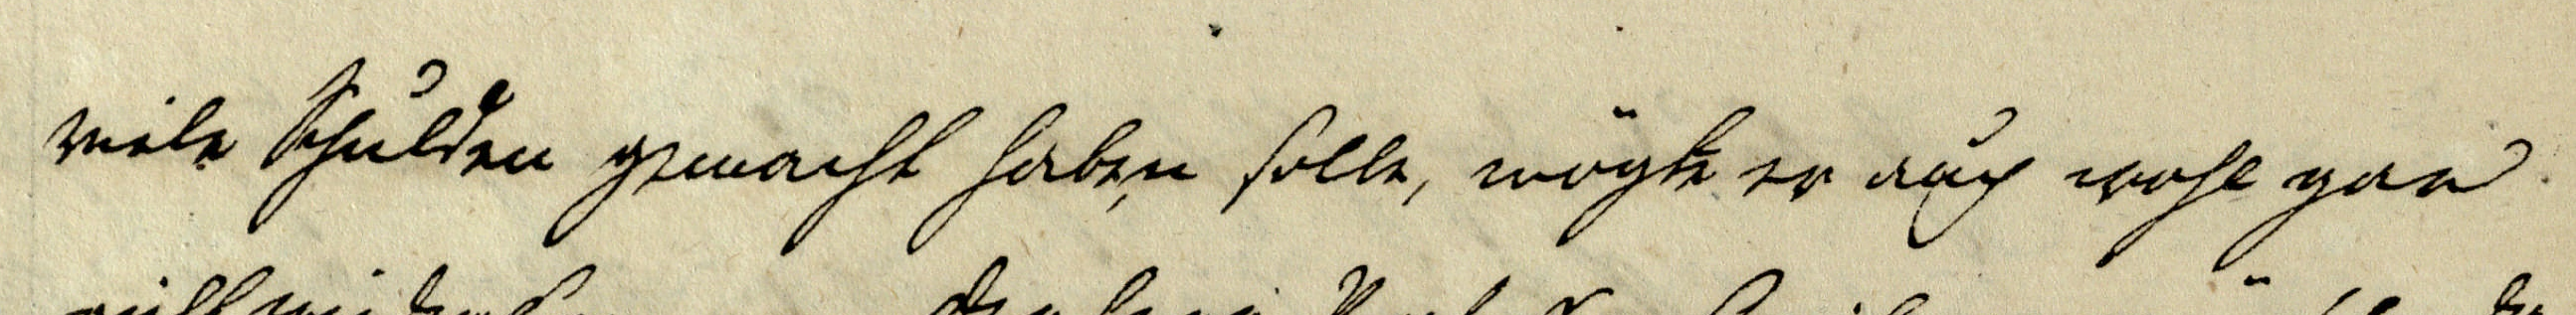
viele Schulden gemacht haben solle, mögte er auch wohl gar
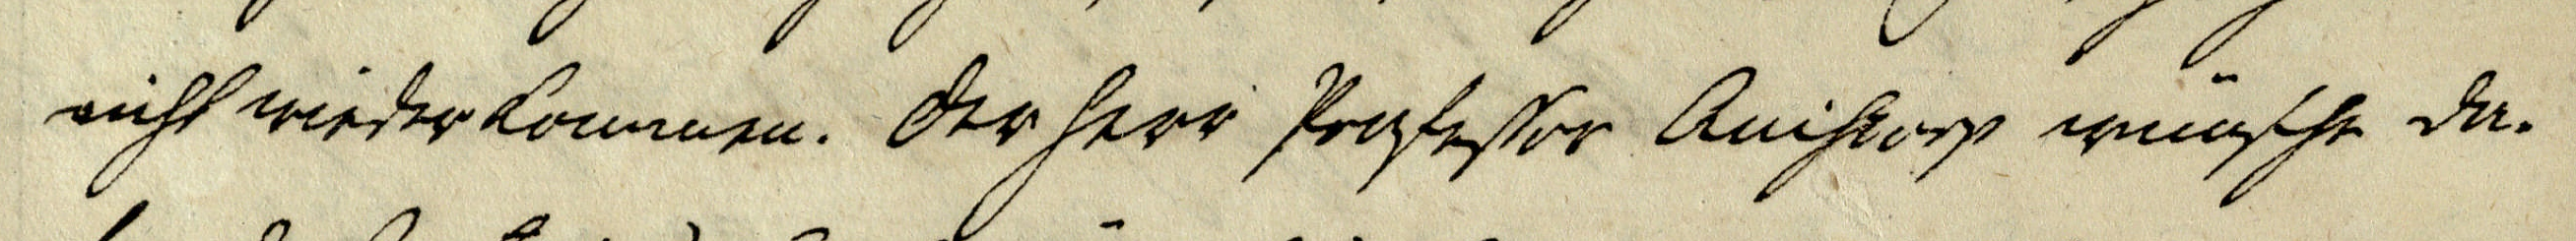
nicht wiederkommen. Der Herr Professor Quistorp wünsche da¬
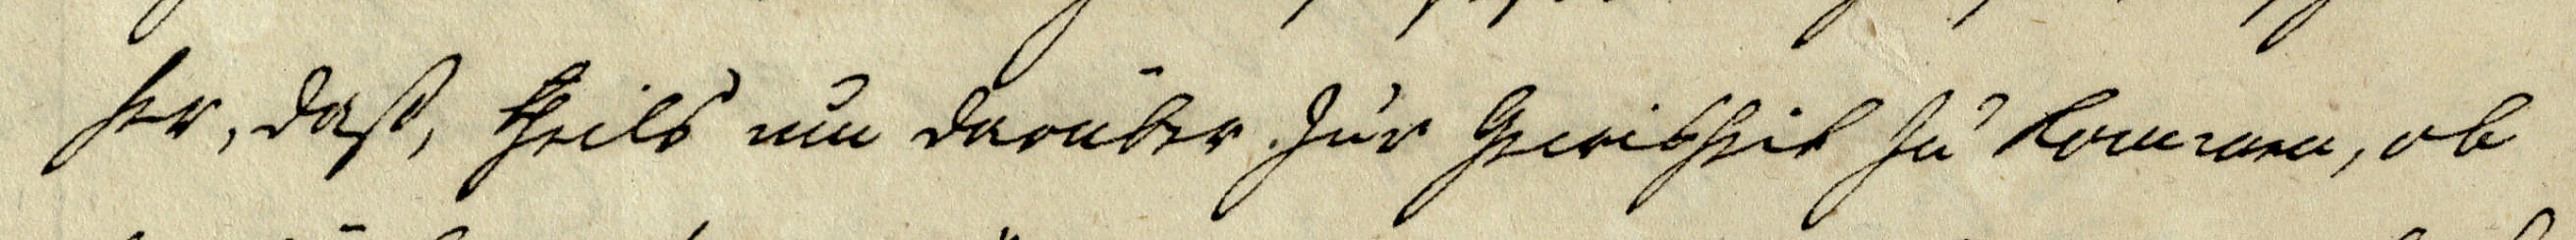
her, daß, theils um darüber zur Gewisheit zu kommen, ob
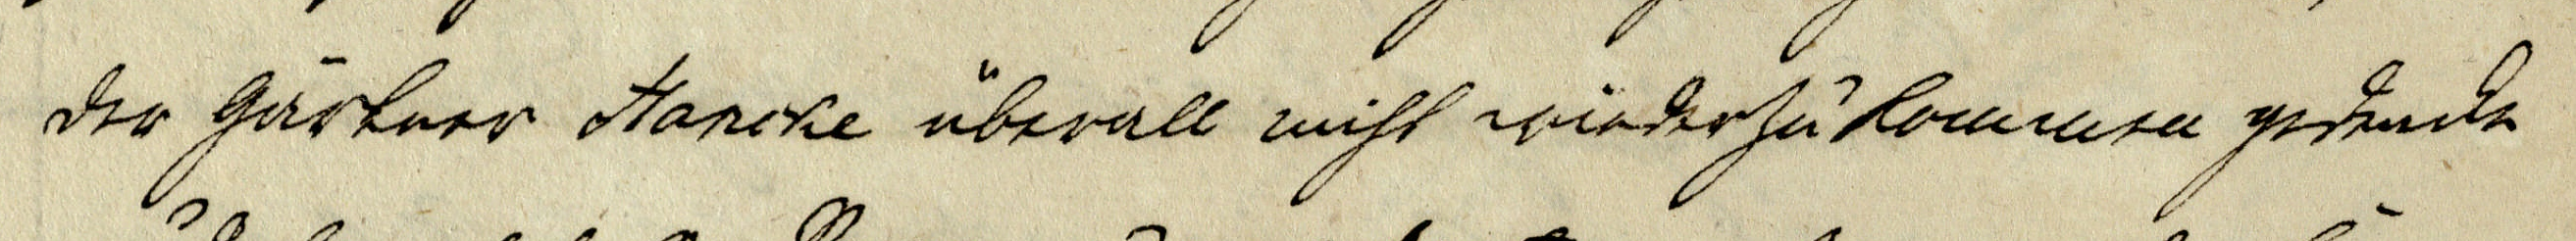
der Gärtner Hancke überall nicht wiederzukommen gedencke
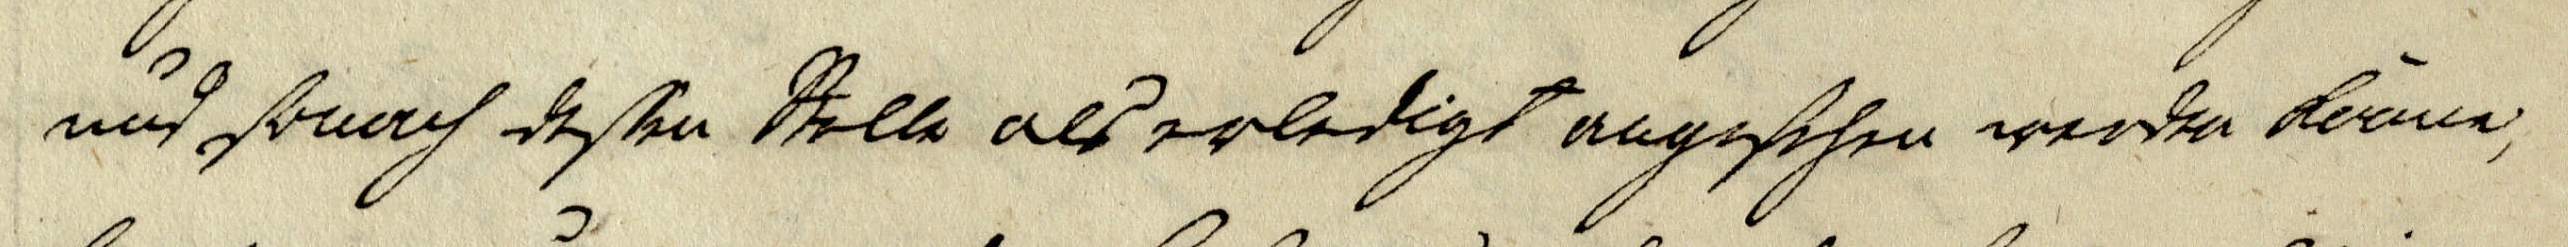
und sonach dessen Stelle als erledigt angesehen werden könne,
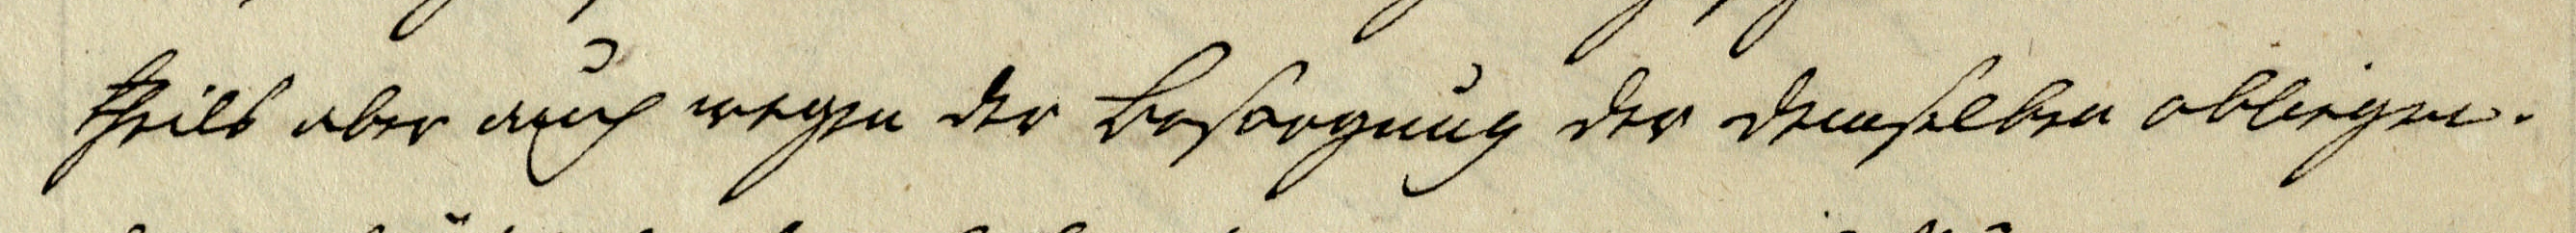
theils aber auch wegen der Besorgung der demselben obliegen¬
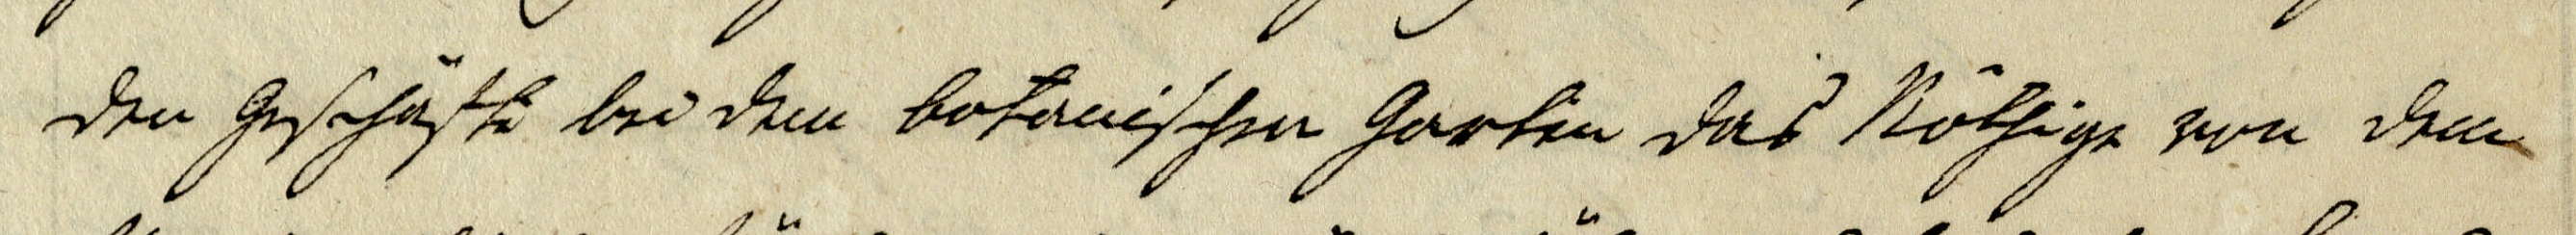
den Geschäfte bei dem botanischen Garten das Nöthige von dem
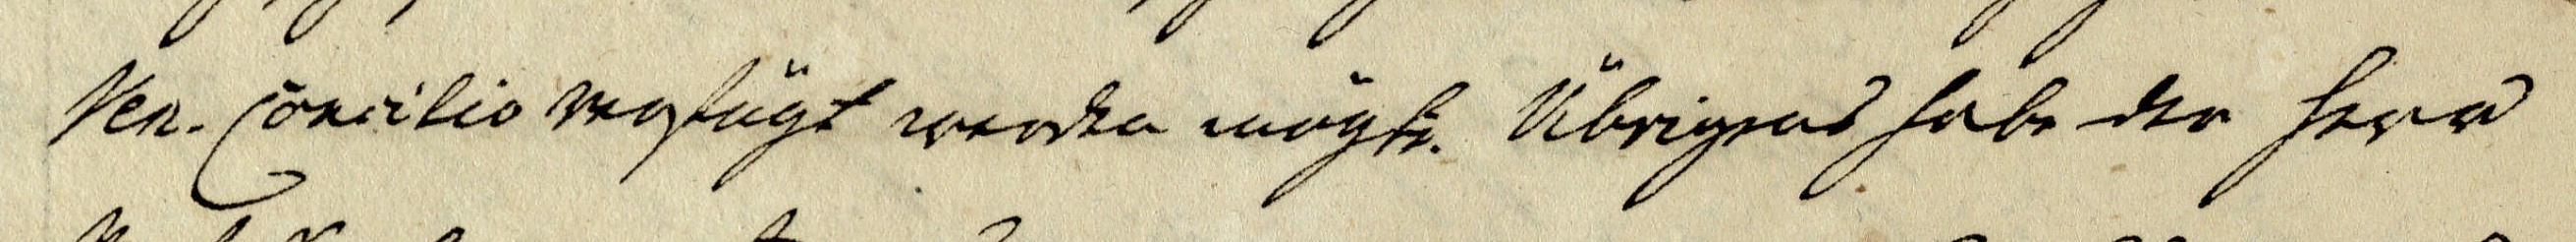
Ven. Concilio verfügt werden mögte. Übrigens habe der Herr
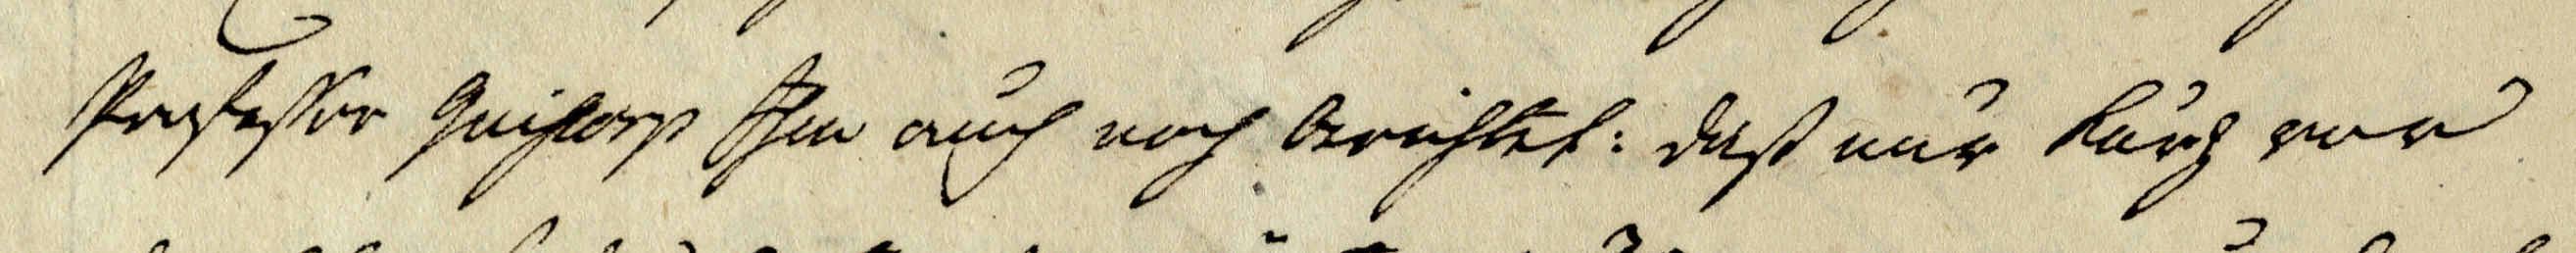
Professor Quistorp Ihm auch noch berichtet: daß nur kurz vor
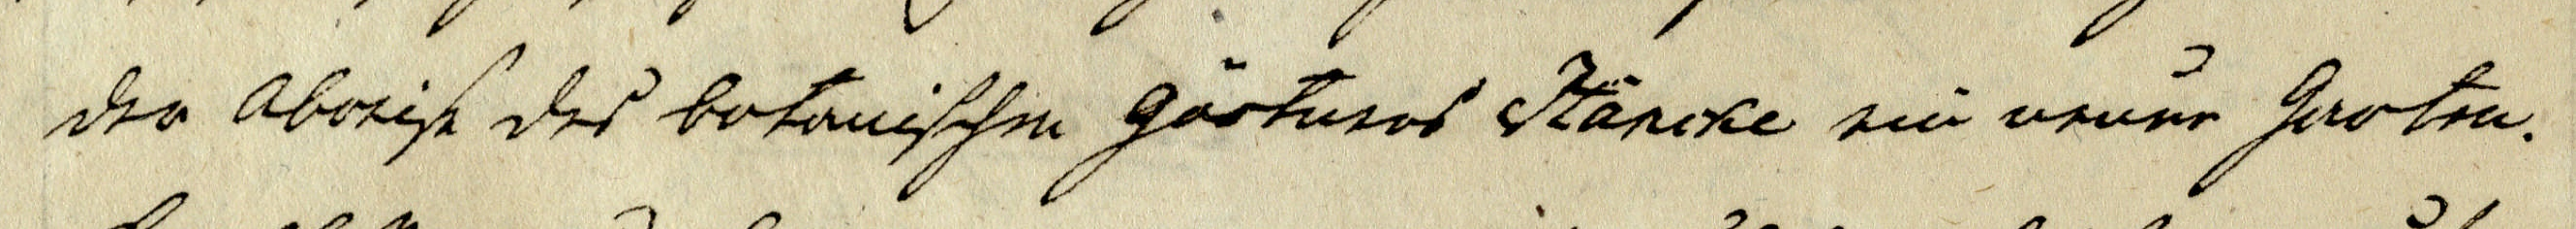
der Abreise des botanischen Gärtners Hancke ein neuer Garten¬
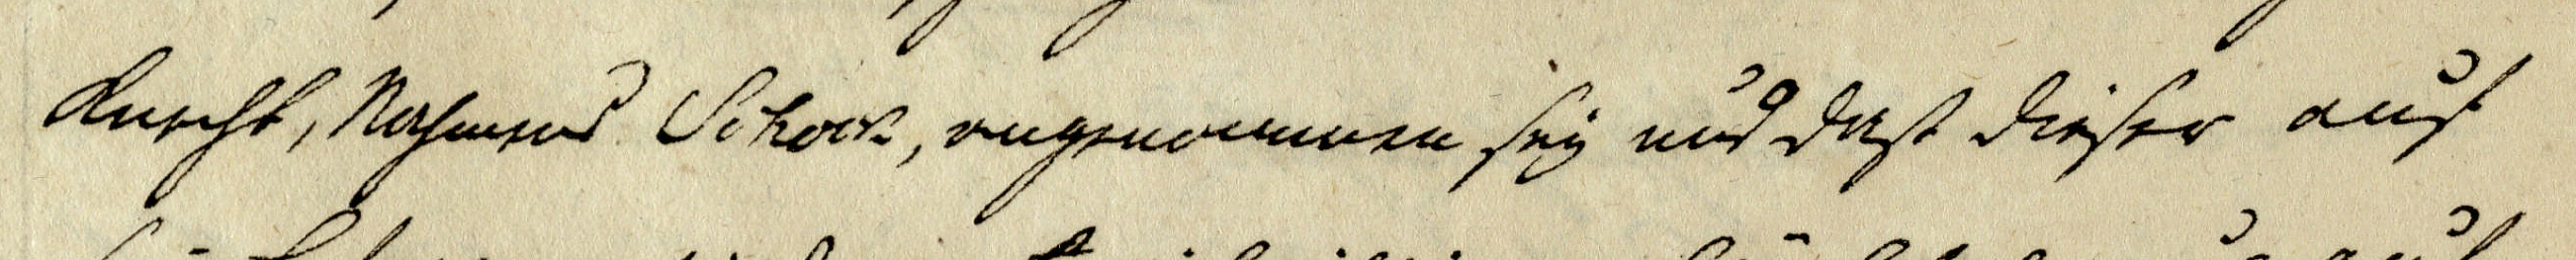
knecht, Nahmens Schock, angenommen seÿ und daß dieser auf
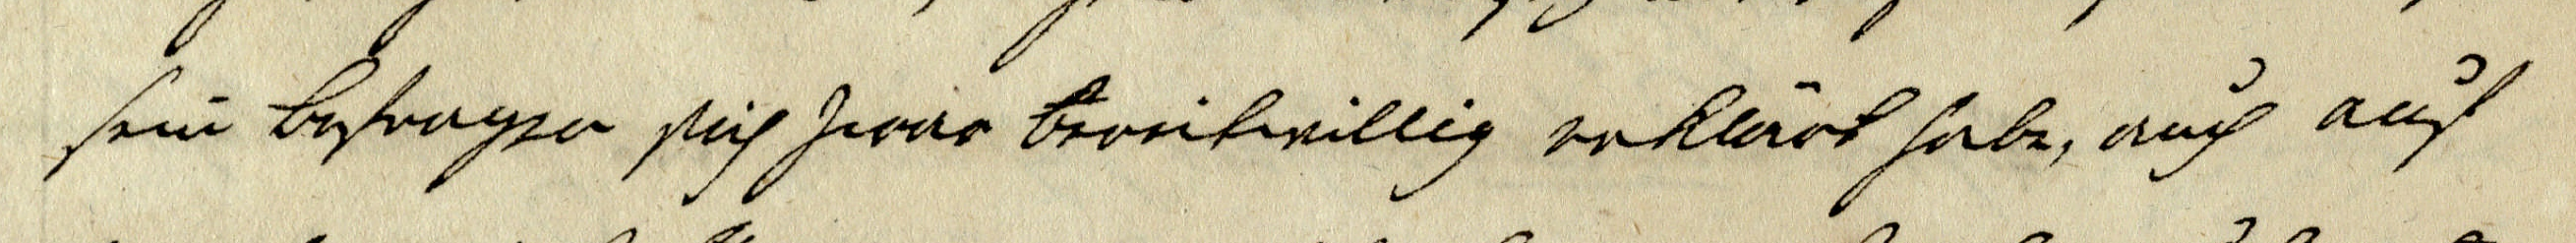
sein Befragen sich zwar bereitwillig erklärt habe, auch auf
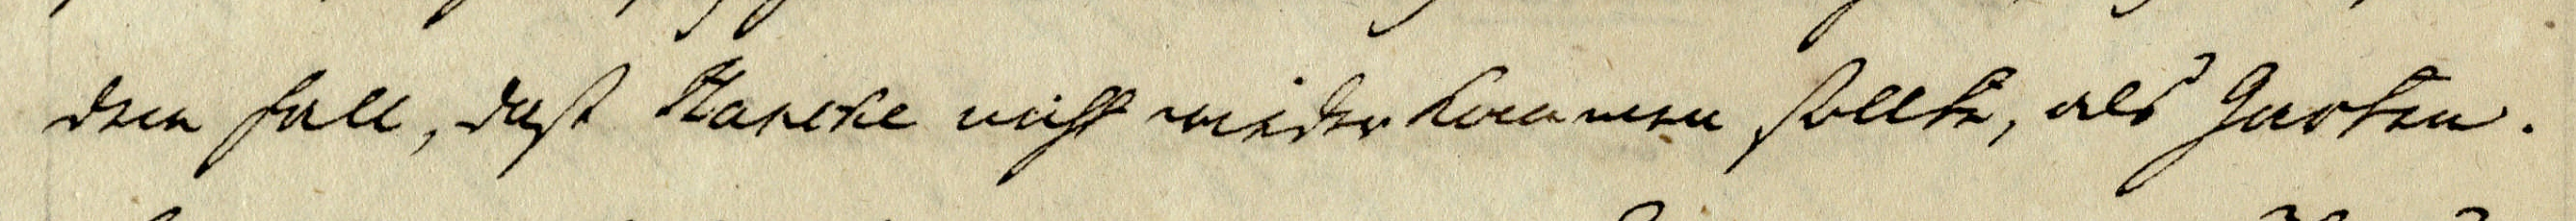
dem Fall, daß Hancke nicht wiederkommen sollte, als Garten¬
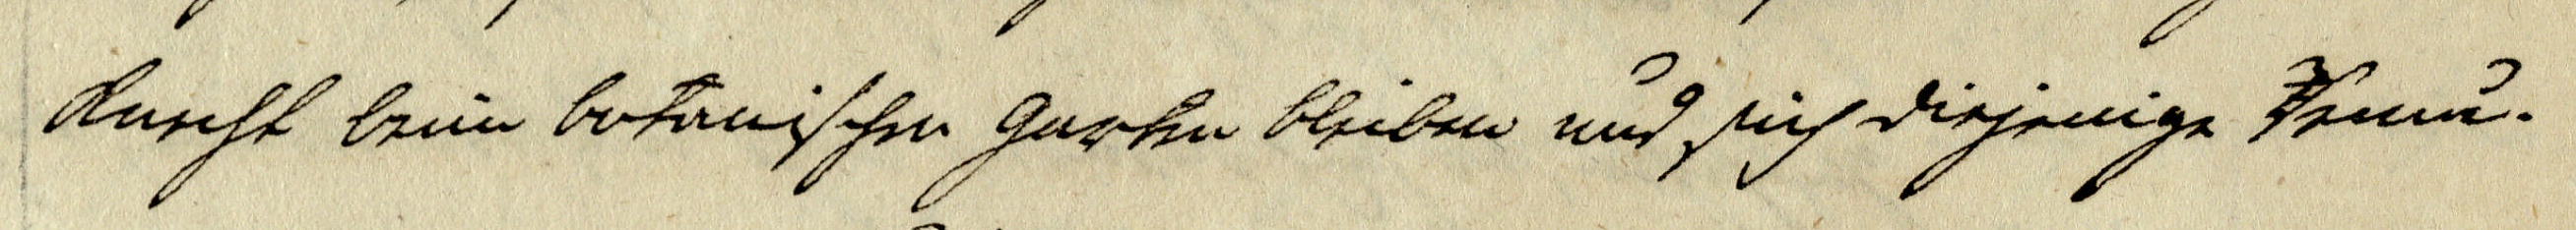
knecht beim botanischen Garten bleiben und sich diejenige Remu¬
